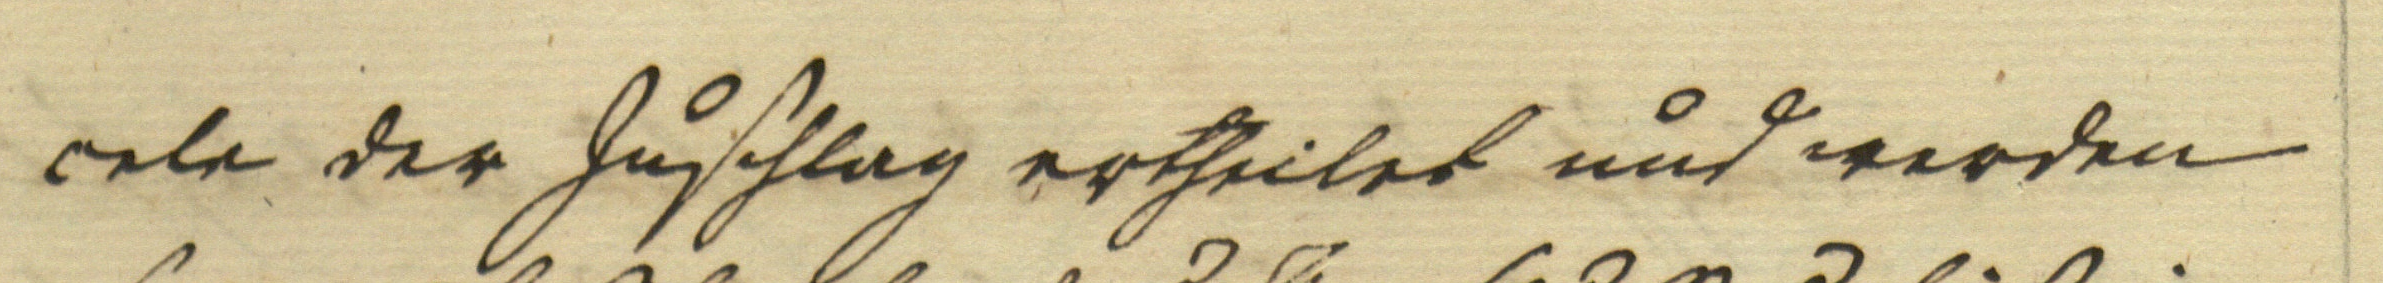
cele der Zuschlag ertheilet und werden
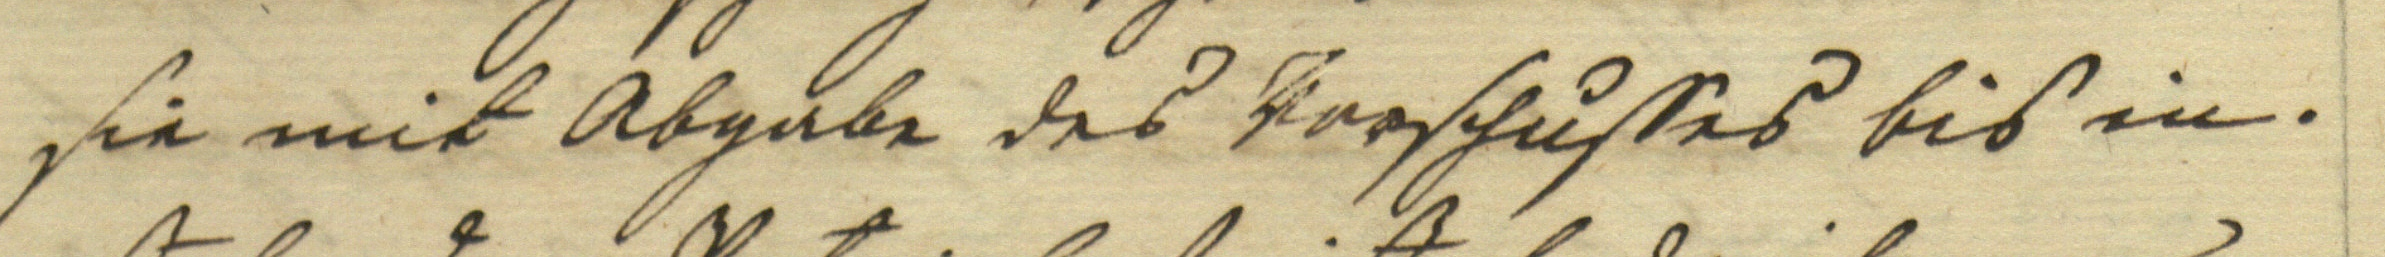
sie mit Abgabe des Vorschusses bis in¬
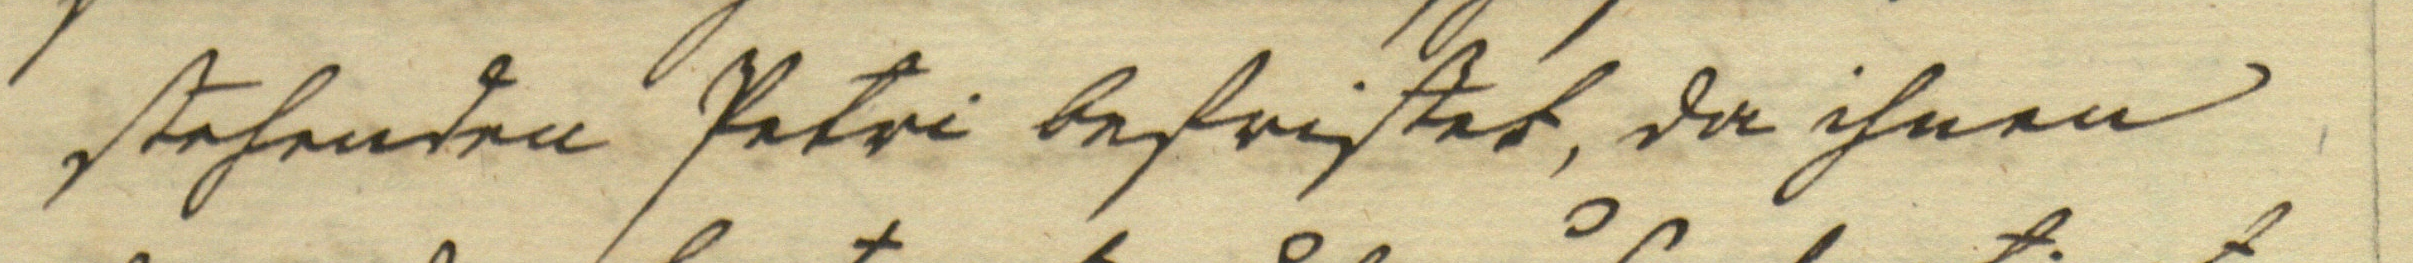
stehenden Petri befristet, da ihnen
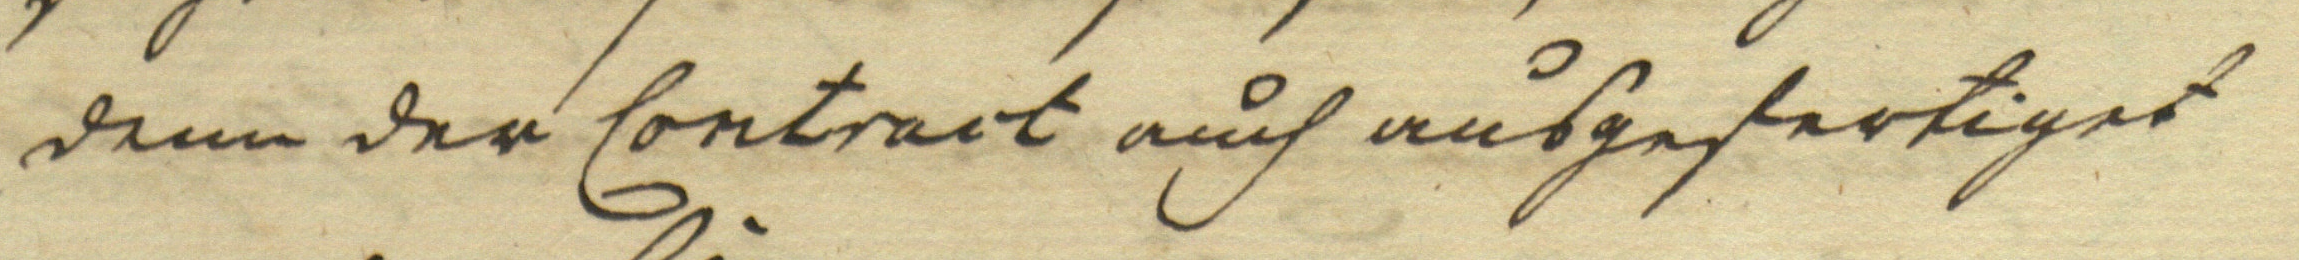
denn der Contract auch ausgefertiget
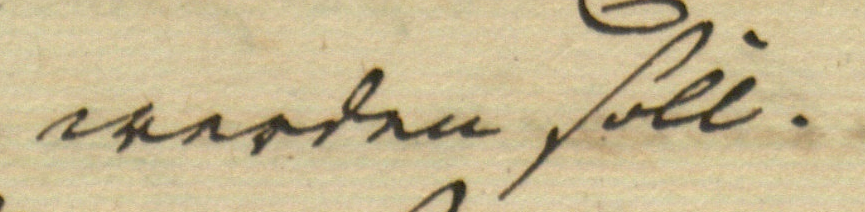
werden soll.
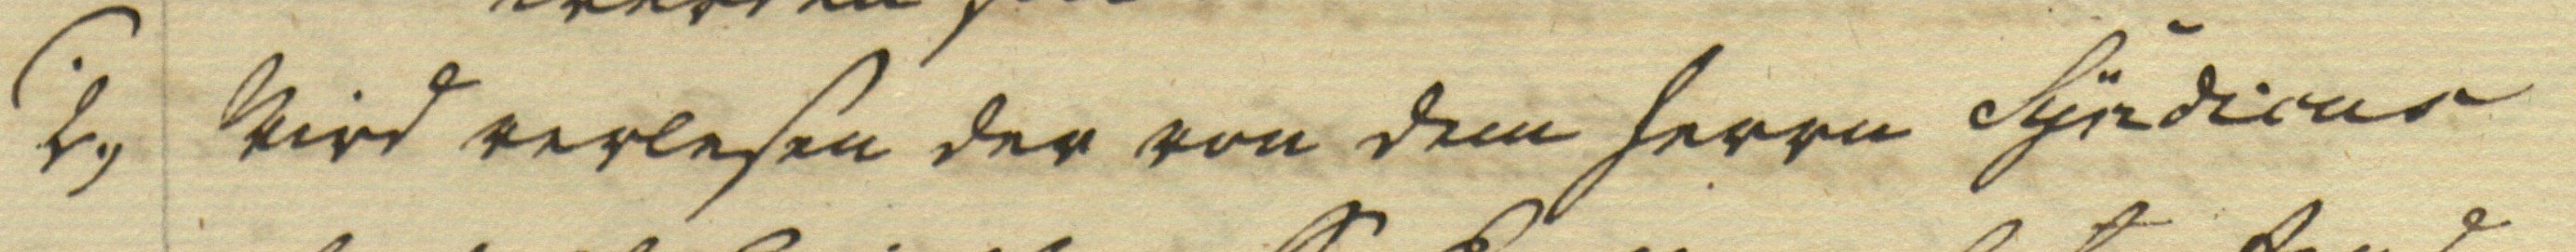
2., Wird verlesen der von dem Herrn Sÿndicus
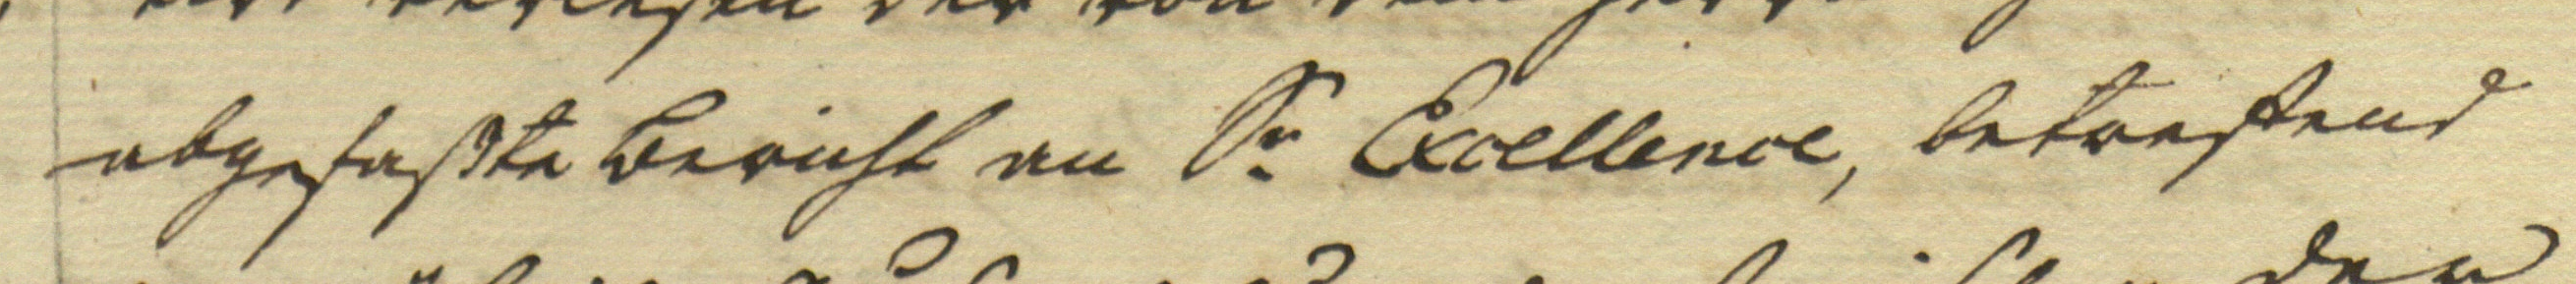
abgefaßte Bericht an Sr Excellence, betreffend
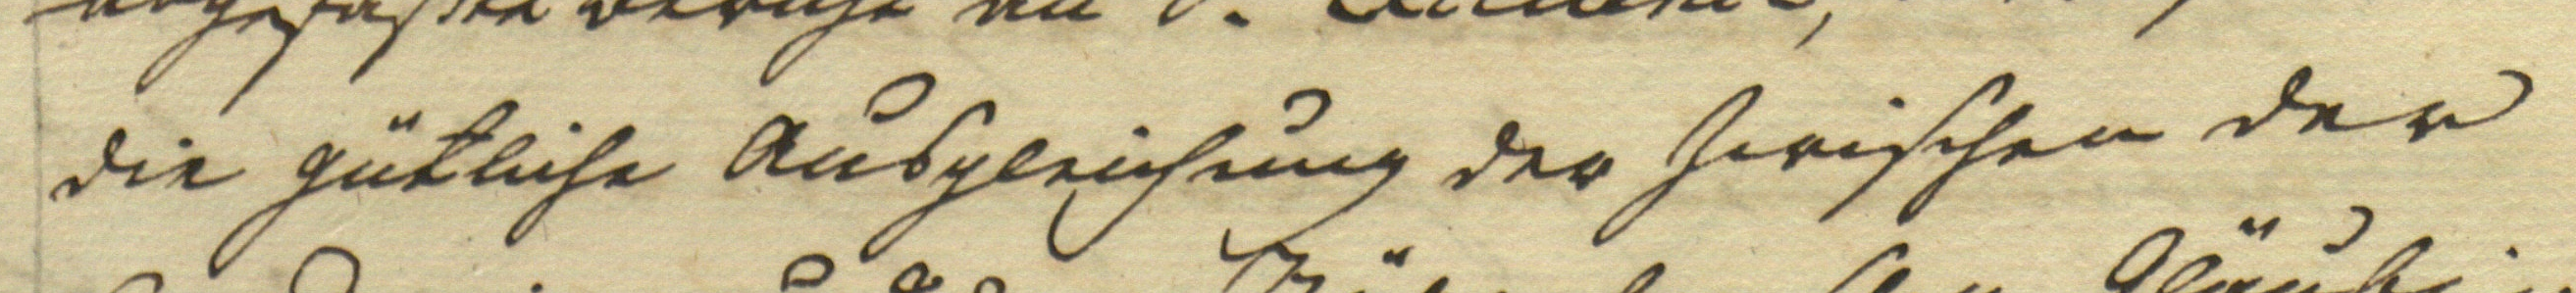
die gütliche Ausgleichung der zwischen der
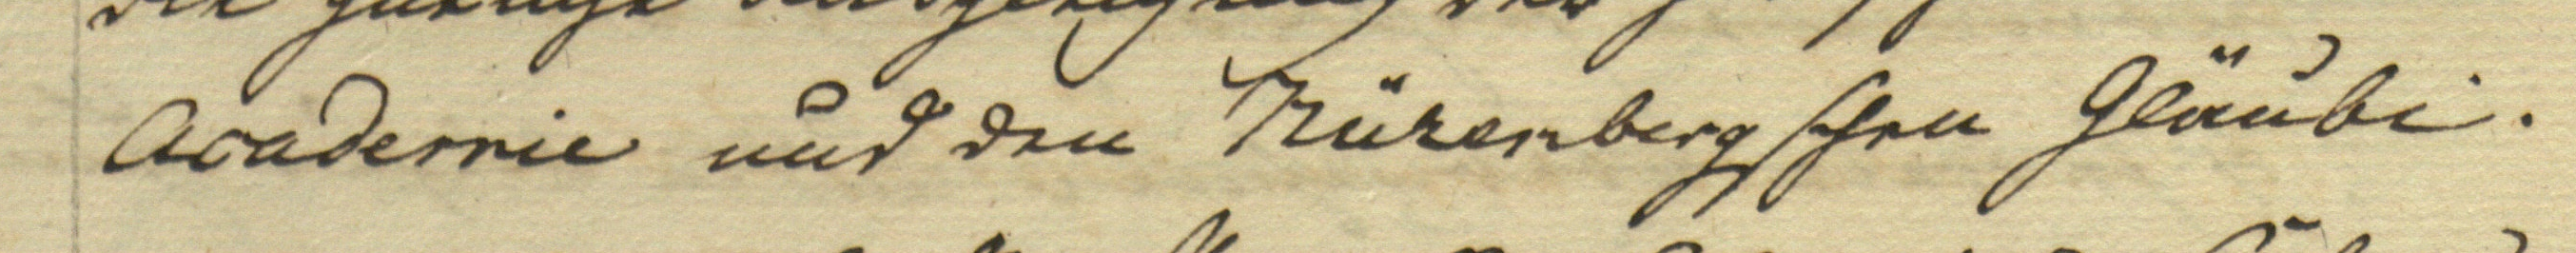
Academie und dem Nürenbergschen Gläubi¬
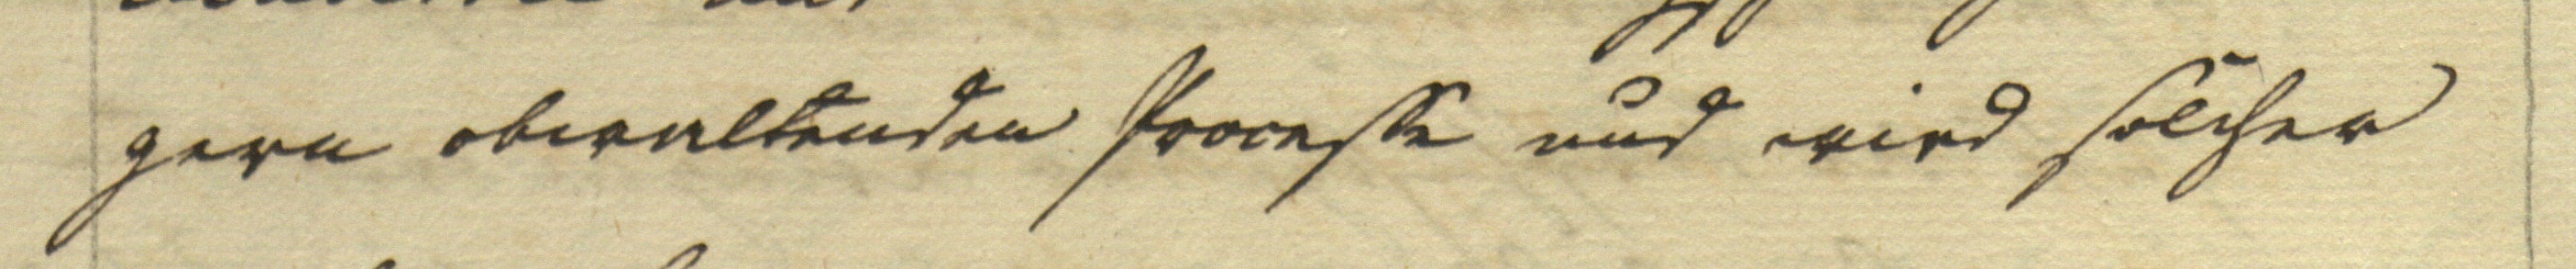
gern obwaltenden Processe und wird solcher
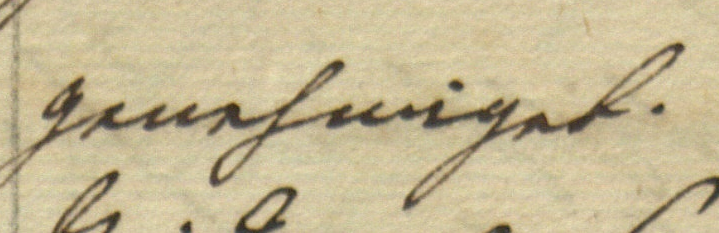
genehmiget.
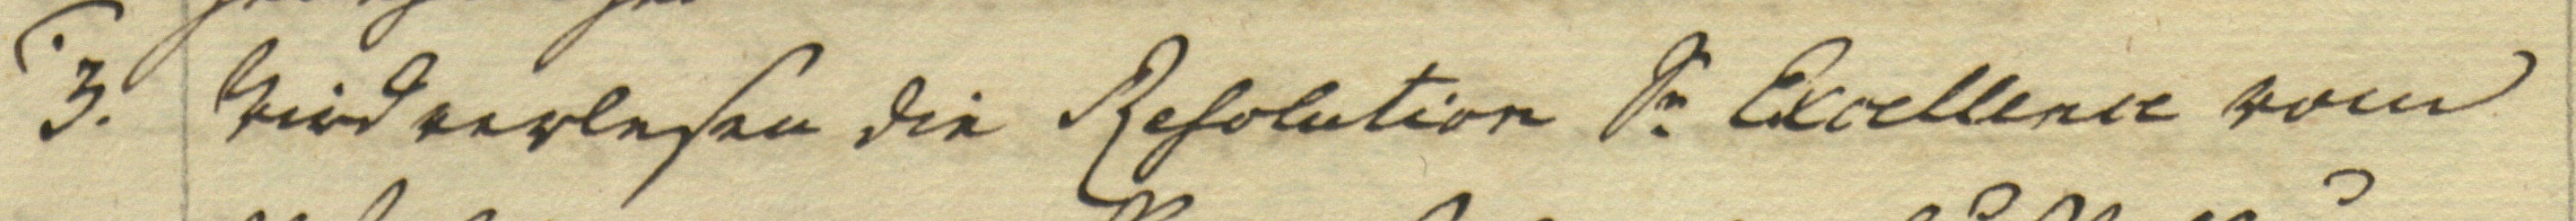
3. Wird verlesen die Resolution Sr Excellence vom
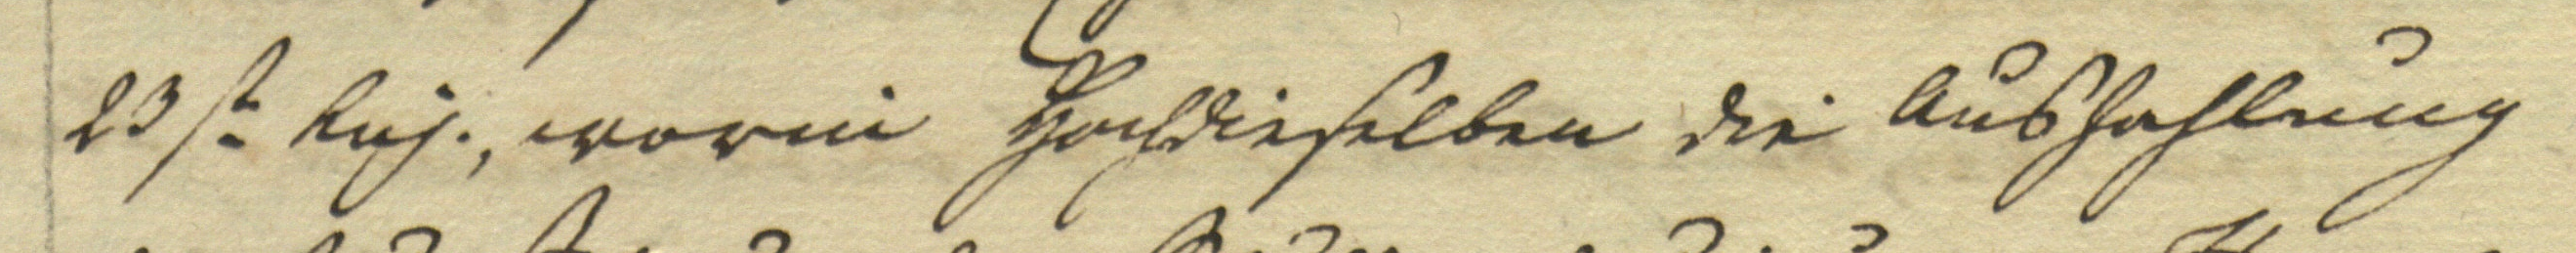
23 st huj., worin Hochdieselben die Auszahlung
